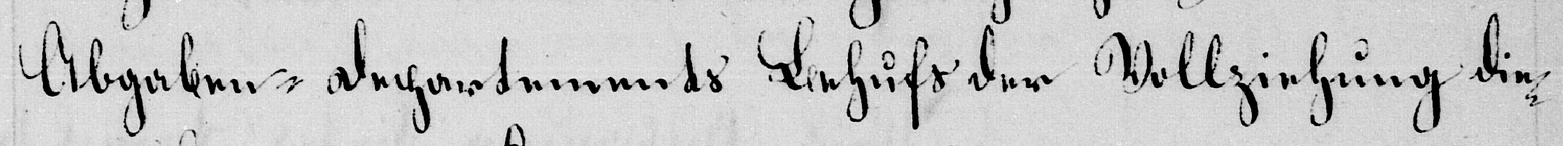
Abgaben-Departements Behufs der Vollziehung die¬
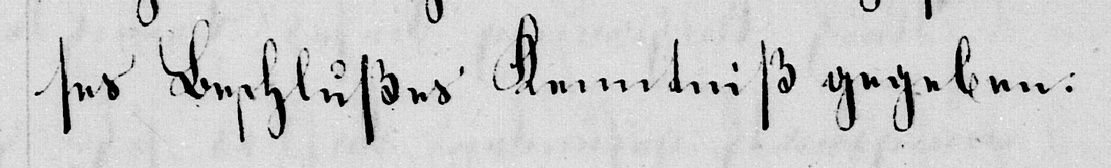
ses Beschlußes Kenntniß gegeben.
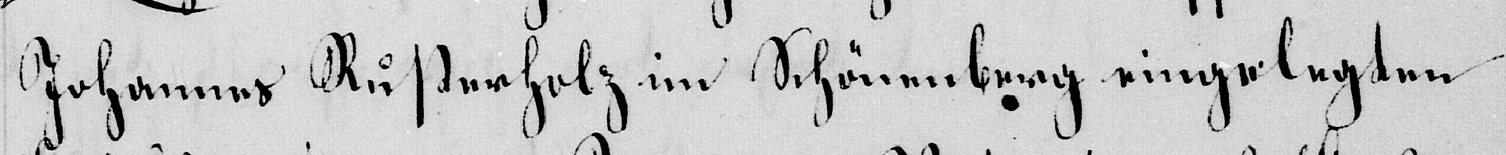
Johannes Rusterholz im Schönenberg eingelegten
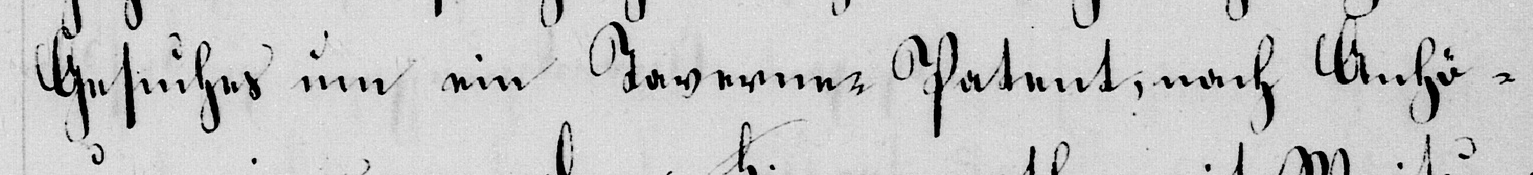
Gesuches um ein Taverne-Patent, nach Anhö¬
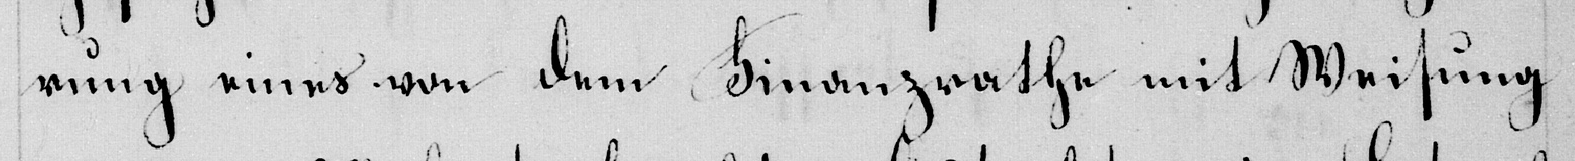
rung eines von dem Finanzrathe mit Weisung
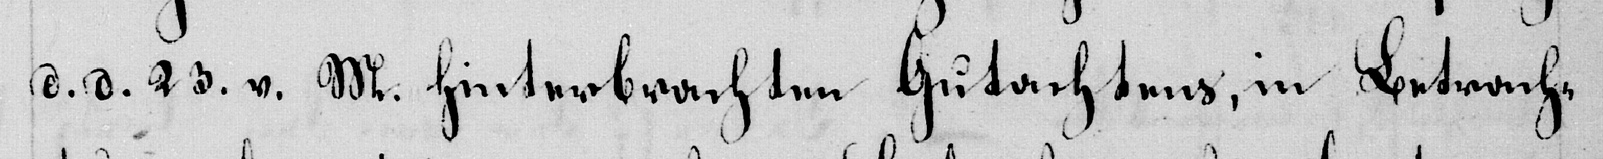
d. d. 23. v. M. hinterbrachten Gutachtens, in Betrach¬
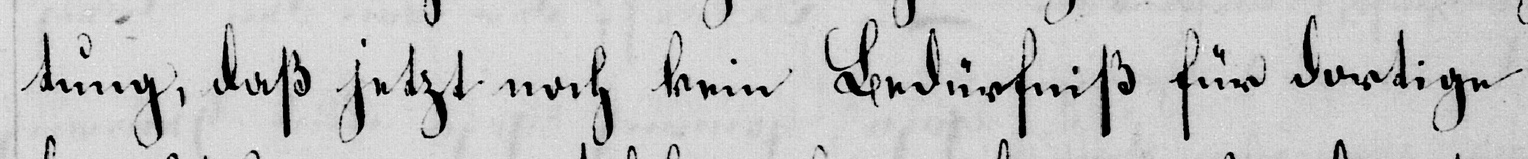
tung, daß jetzt noch kein Bedürfniß für dortige
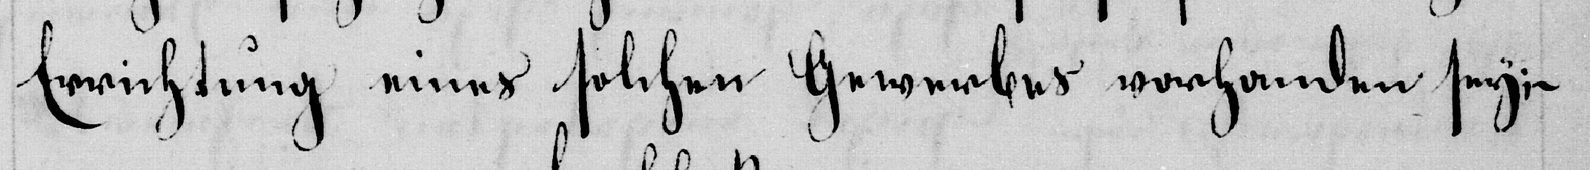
Errichtung eines solchen Gewerbes vorhanden sey, –
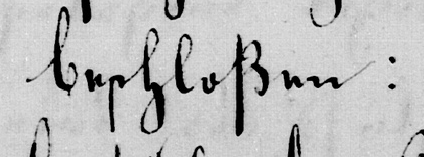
beschloßen:
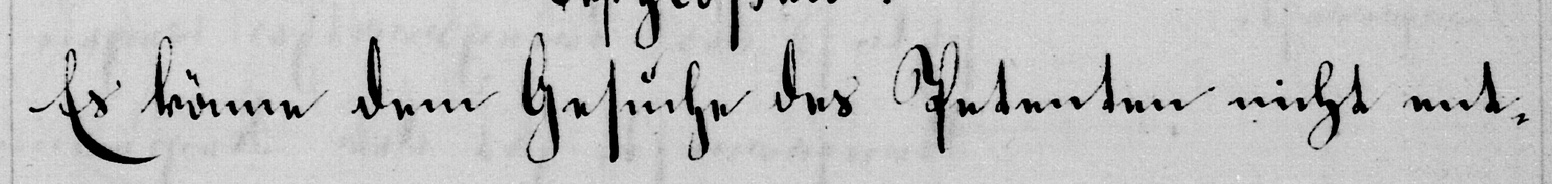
Es könne dem Gesuche des Petenten nicht ent-
